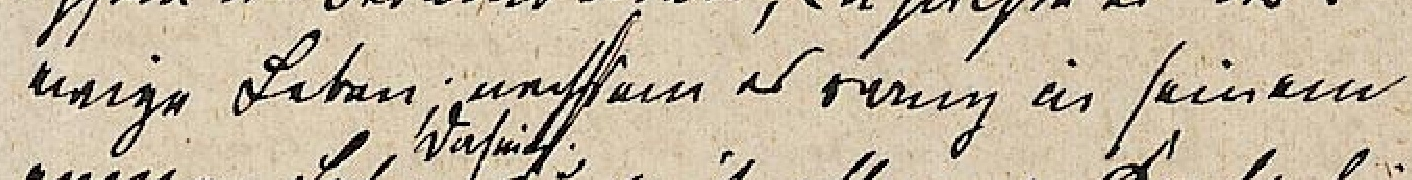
ewige Leben; neclen es rang in seinem
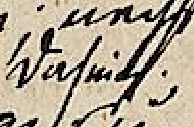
Dasein
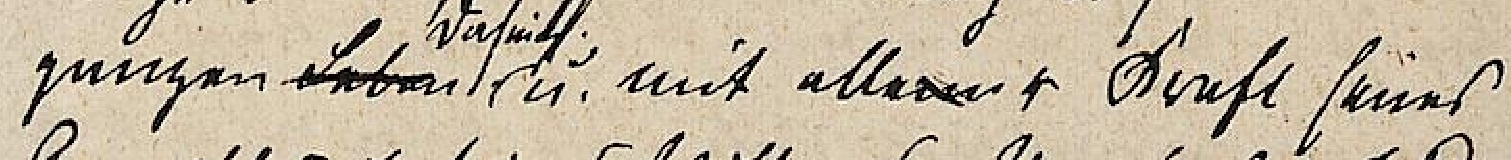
ganzen Leben (u. mit allem r. Kraft seines
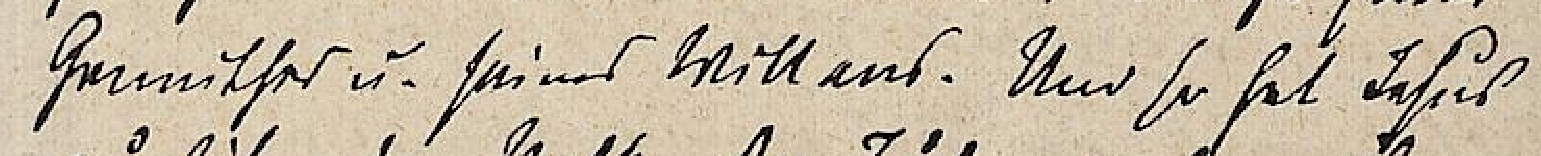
Gemüthes u. seines Willens. Und so hat Jesus
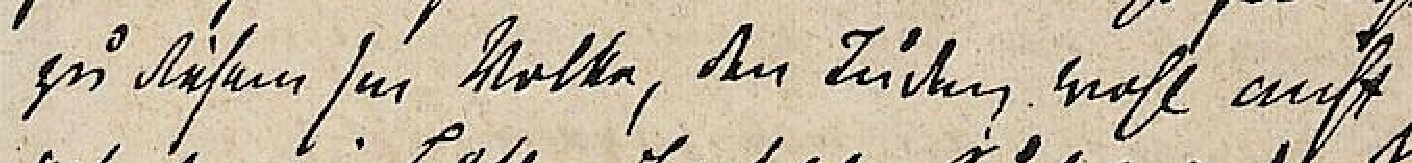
zu diesem sm Volke, den Juden, wohl nicht
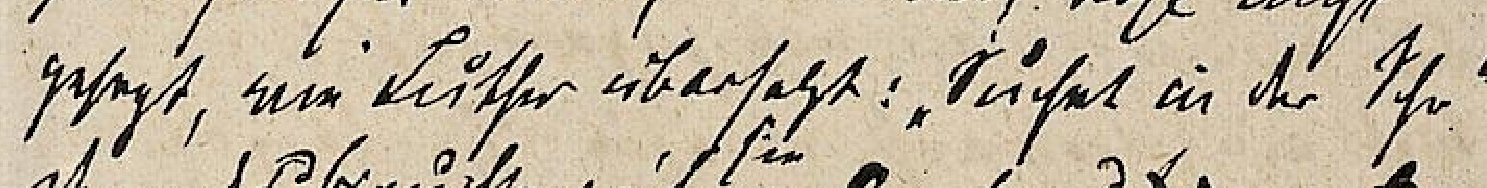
gesagt, wie Luther übersetzt: "Suchet in der Schr."
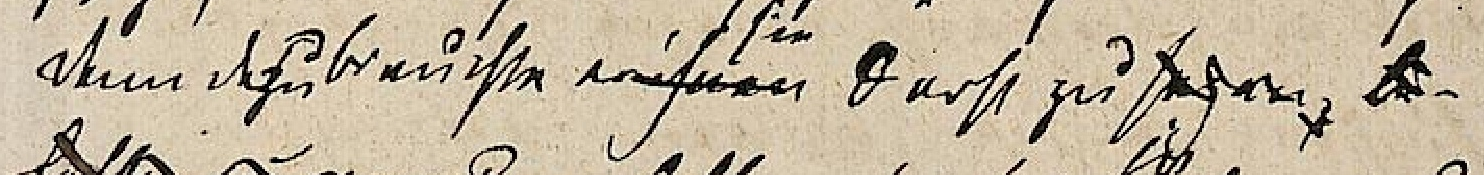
denn dazu breuchter er ihnen o erst zu sagen, be¬
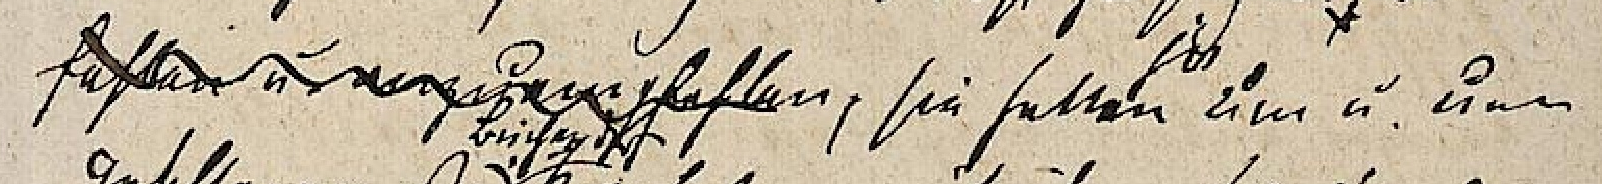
fehlen u. anzuempfehlen, sie sollten um u um¬
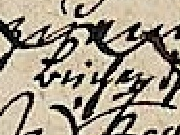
Bücher
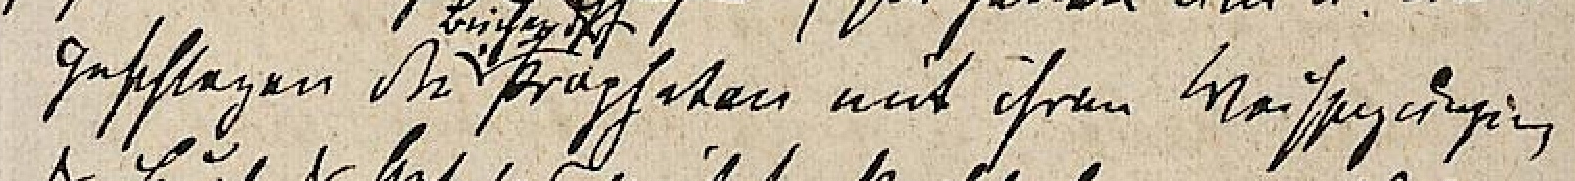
geschlagen die Propheten mit ihren Weissagugen,
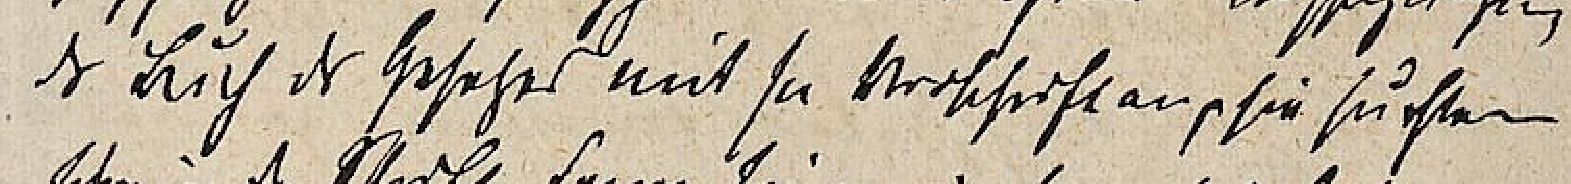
ds Buch ds Gesetzes mit sn Vorschriften, sie suchten
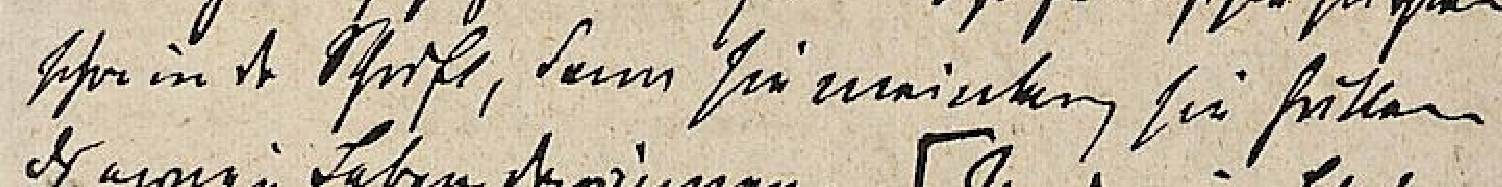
schon in dr Schrift denn sie meinten, sie hätten
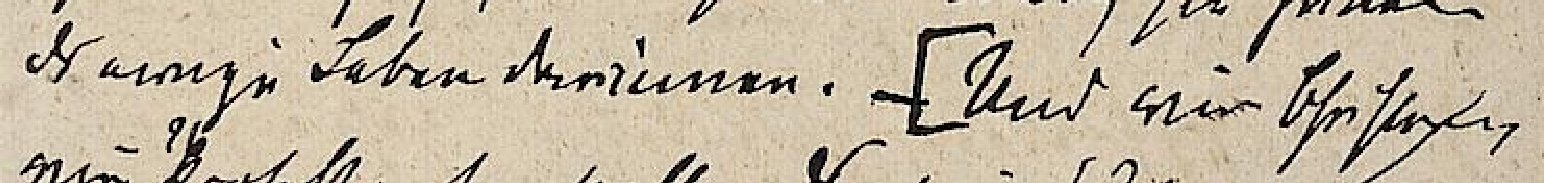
ds ewige Leben darinnen. _ [Und wir Christen,
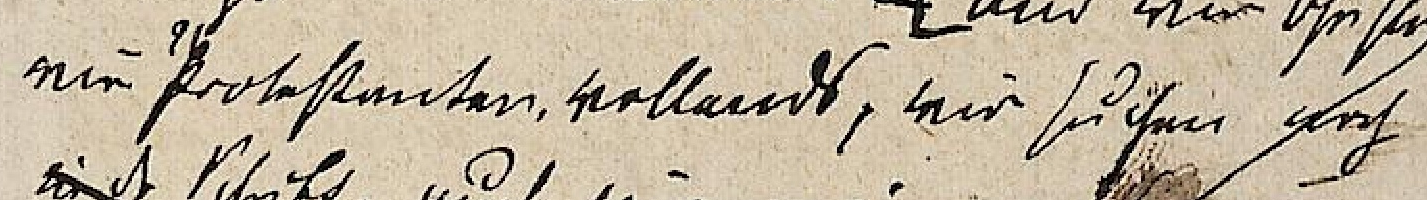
wir Protestanten vollends, wir suchen noch
